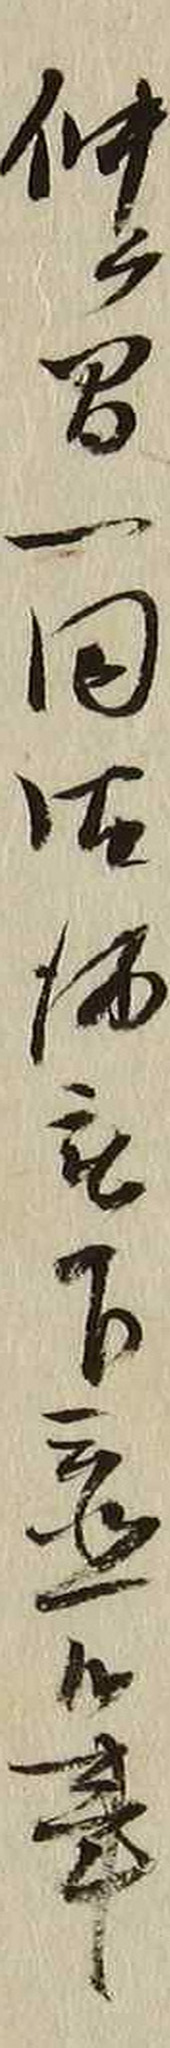仲ケ間一同御酒被下置候事
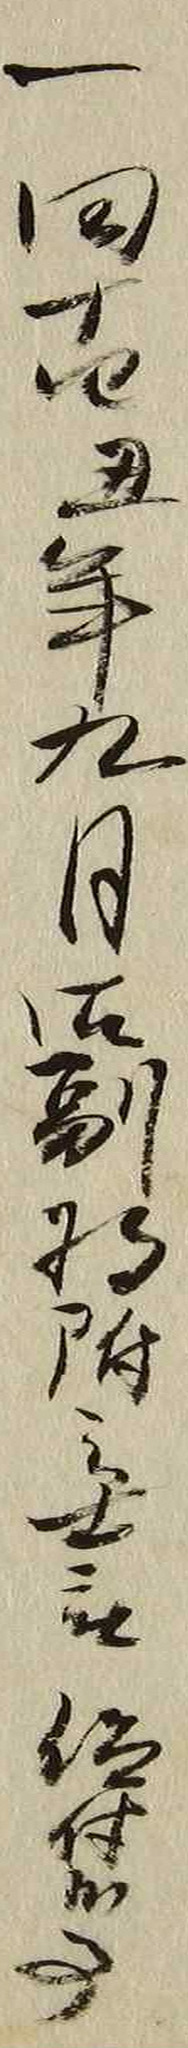一同十四丑年九月御副将附之士被仰付候事
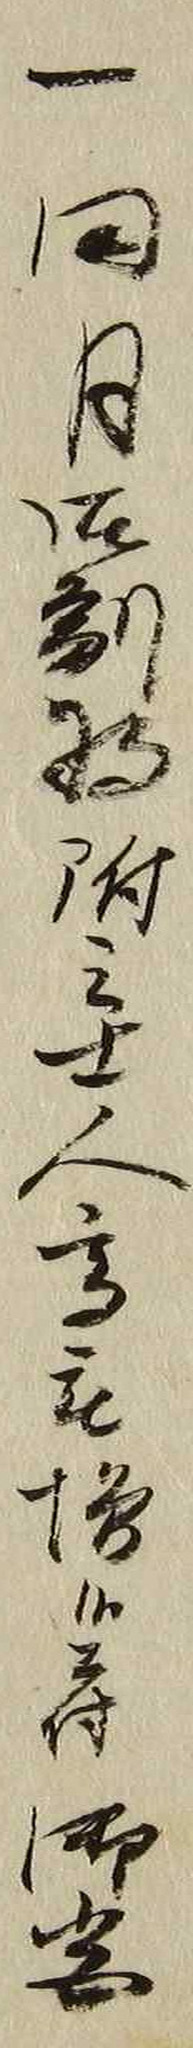一同月御副将附之士人高被増被候付御宮
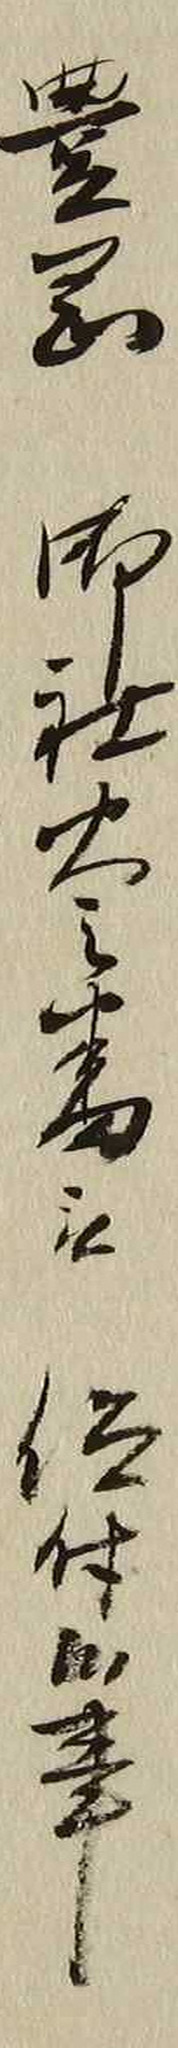豊岡御社火之番被仰付候事
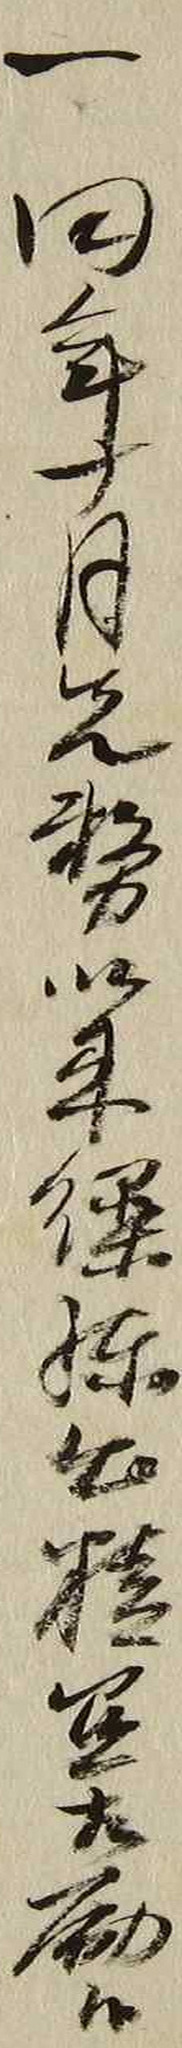一同年十月先務以来繰練出精宜相励候
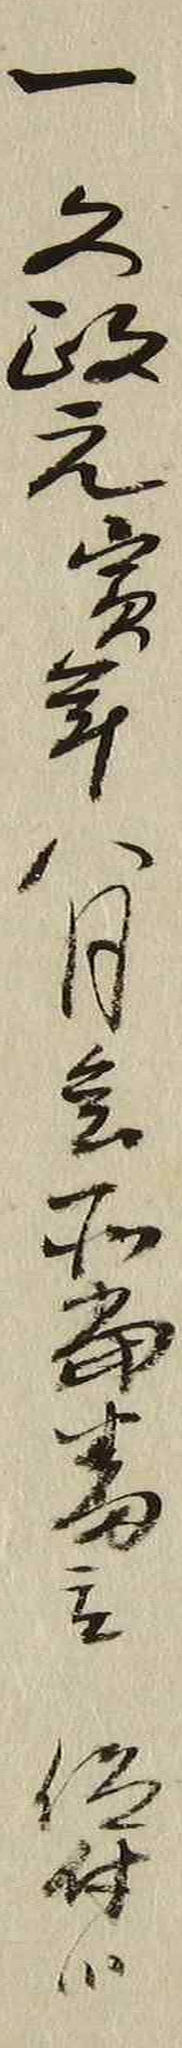一文政元寅年八月会所当番被仰付候
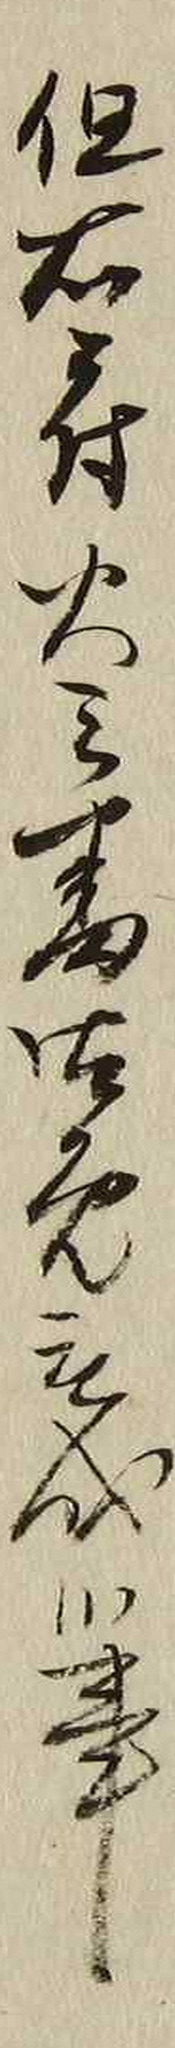但右付火之番御免被成候事
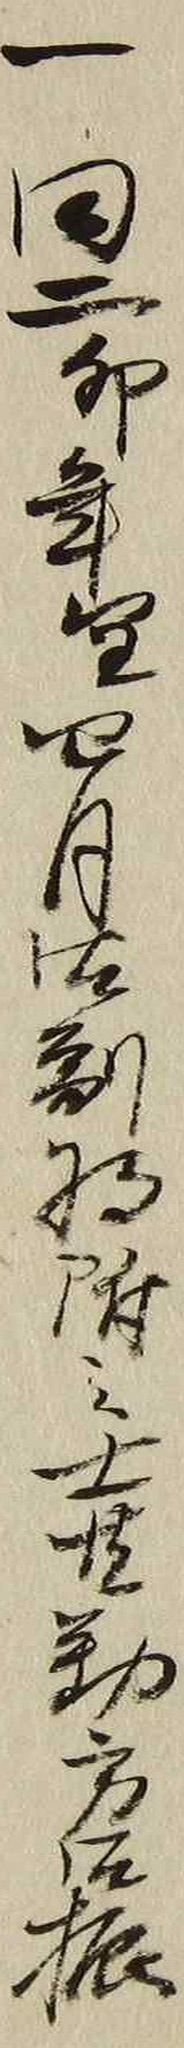一同二卯年閏四月御副将附之士共勤方御振
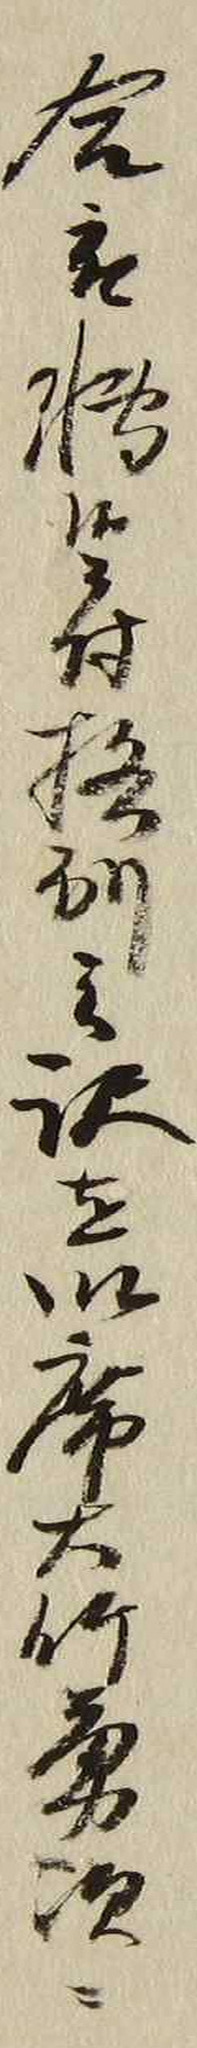合被転候付格別之訳を以席大竹勇次
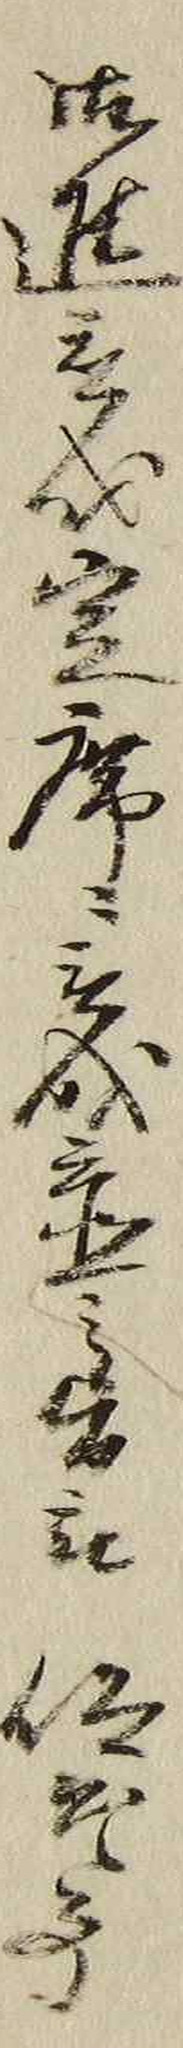御進被成定席被成置之旨被仰出候事
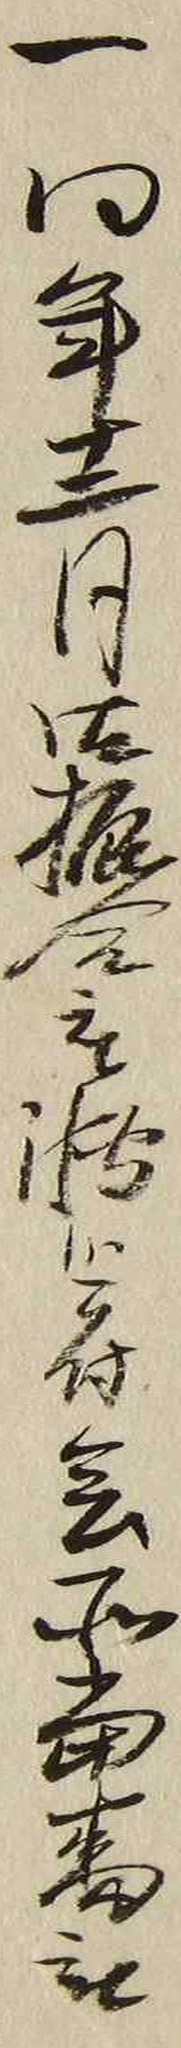一同年十二月御振合被転候付会所当番被
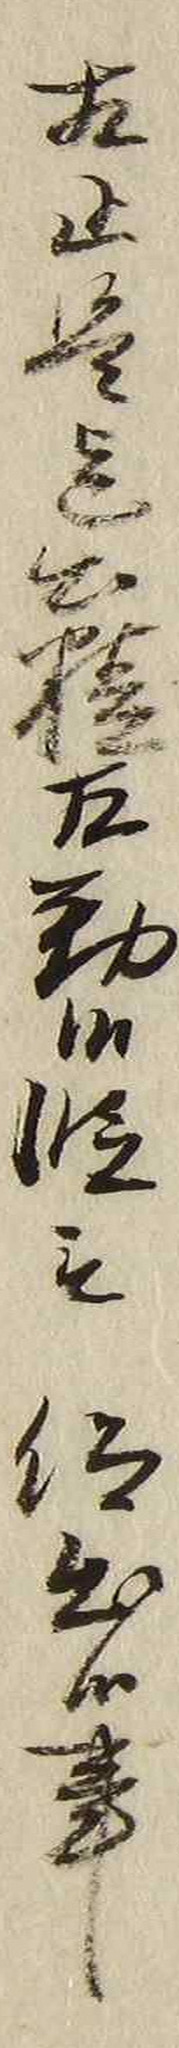相止是迄出精相勤候段被仰出候事

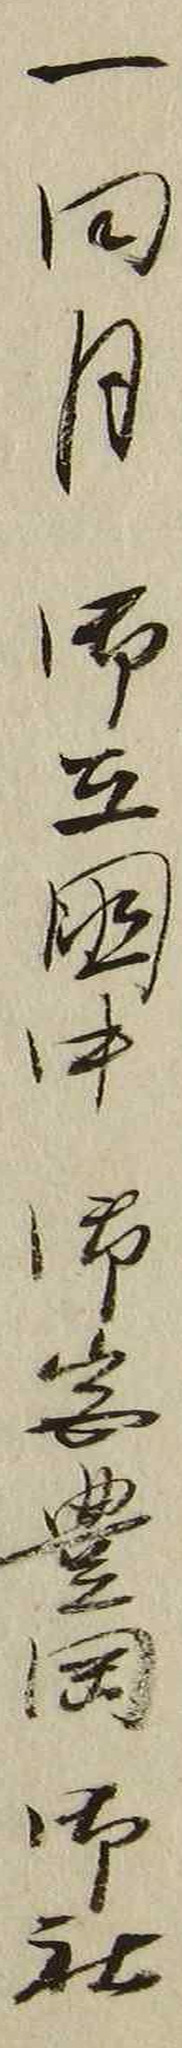一同月御在国中御宮豊岡御社
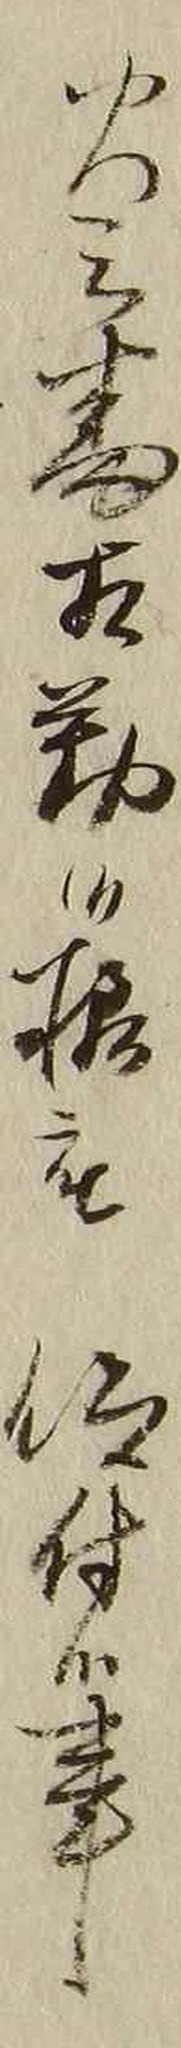火之番相勤候様被仰付候事
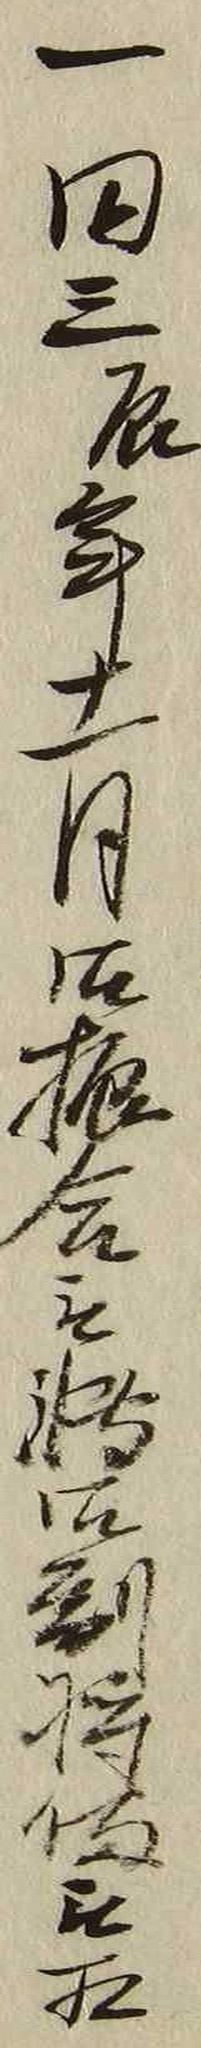一同三辰年十一月御振合被転御副将備被相
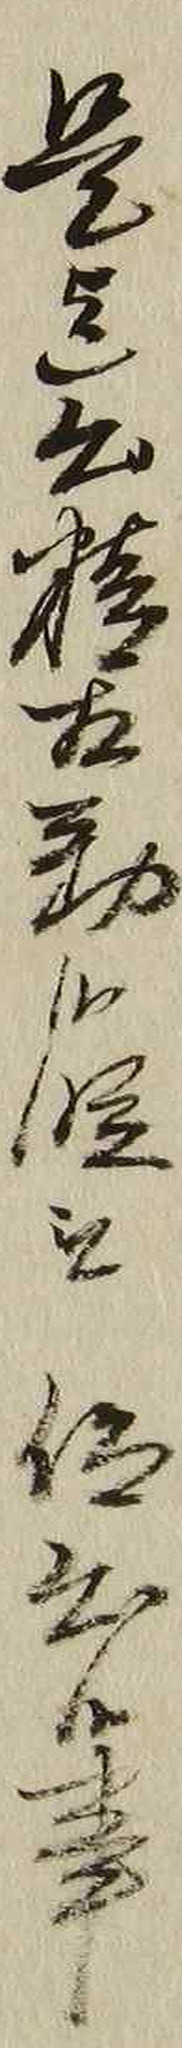是迄出精相勤候段被仰出候事
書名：諸士系譜　巻之350　せ之部1冊全
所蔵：会津若松市立会津図書館
